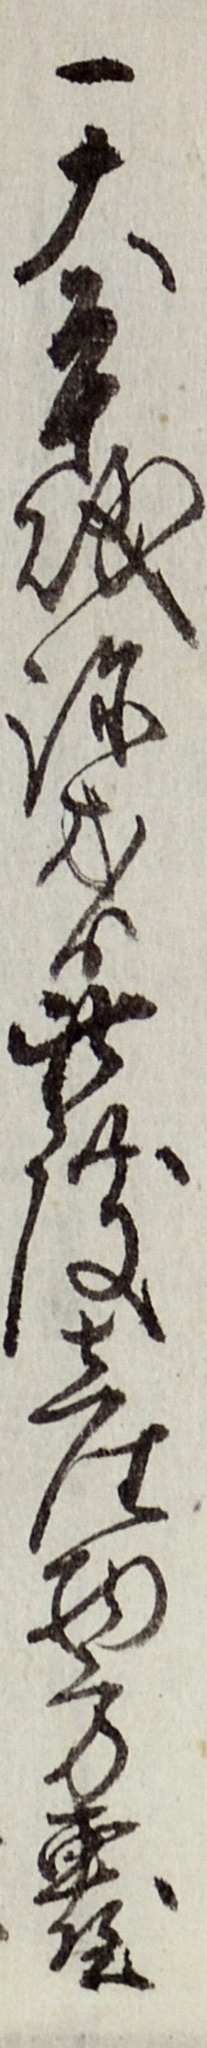一大平磯弥方ゟ此度産物方車屋
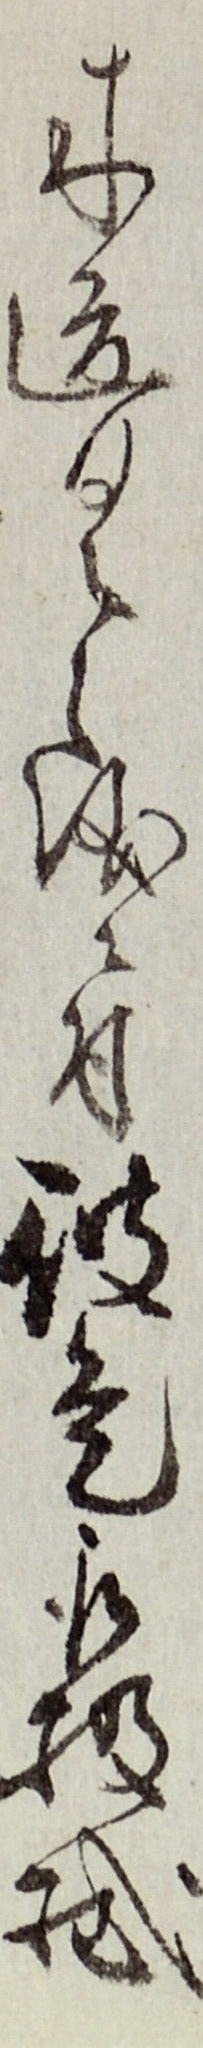木道具之儀ニ付彼是取扱掛
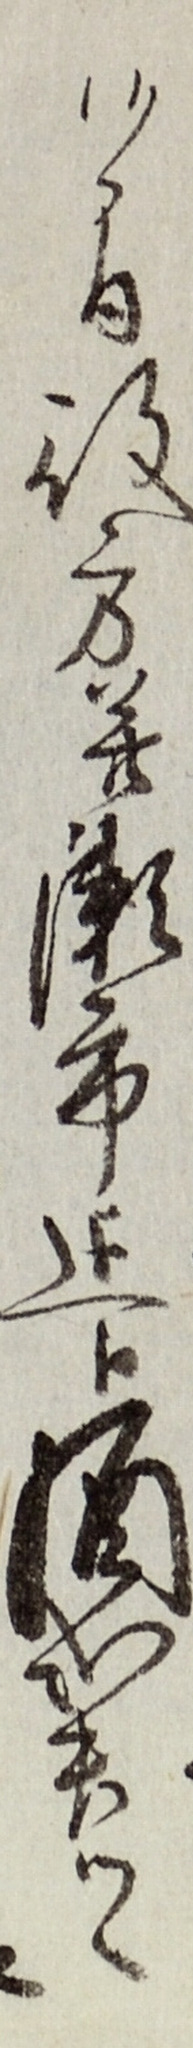候間役方并瀬市迄江酒弐升ツヽ
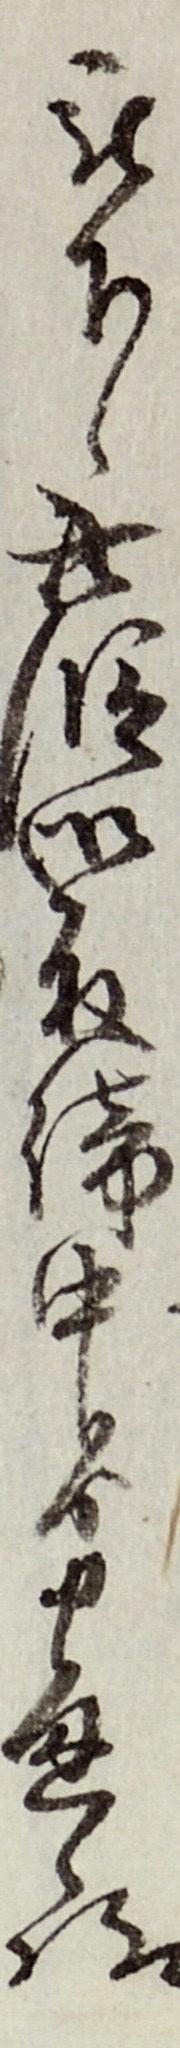被下候此段御取締中ゟ申通候様
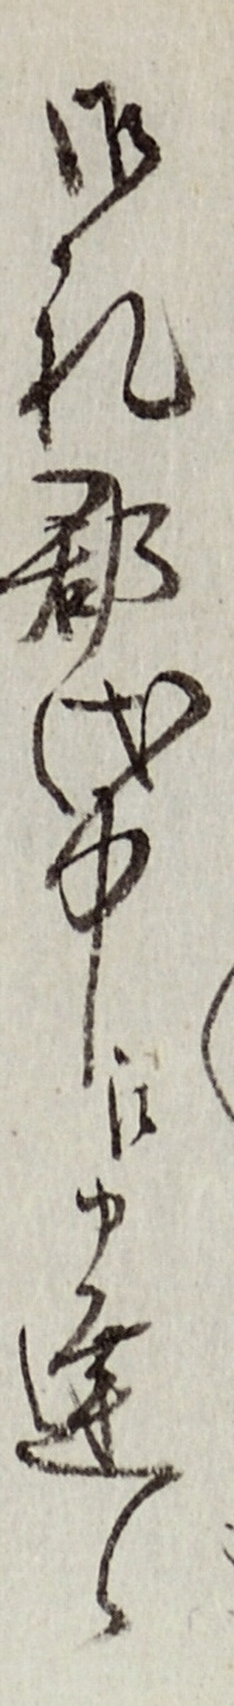御礼郡代中江申達候
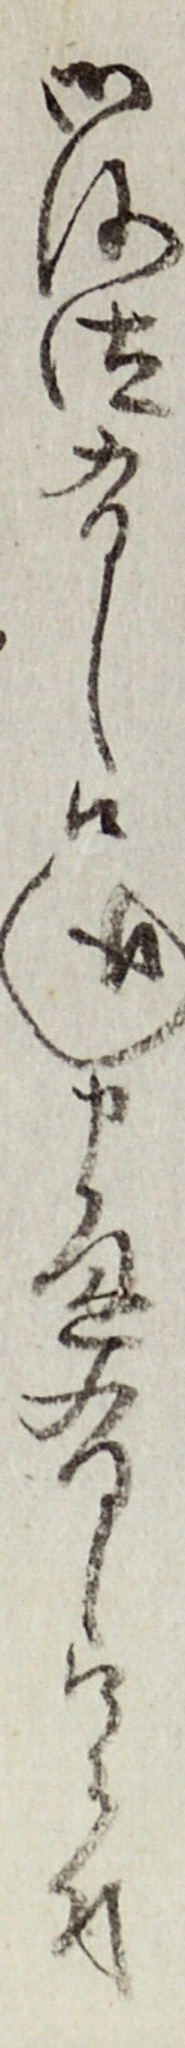御沙汰有之候趣申通有之候ニ付
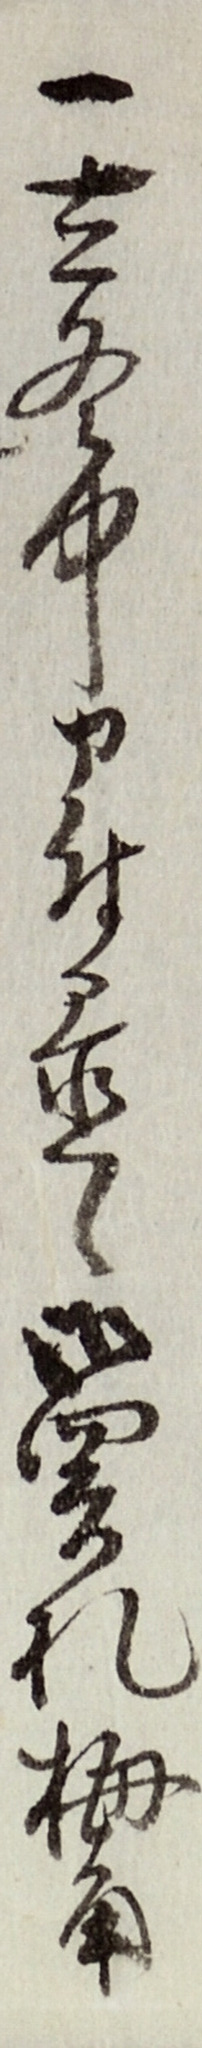一去冬中申付置候御買札栂角
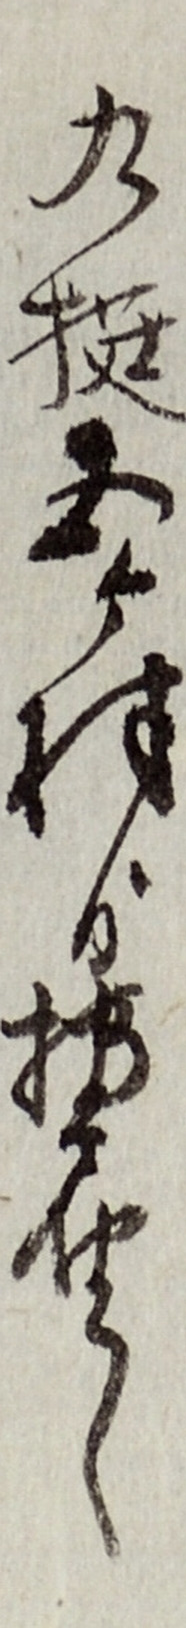九挺五ケ村ゟ持届候
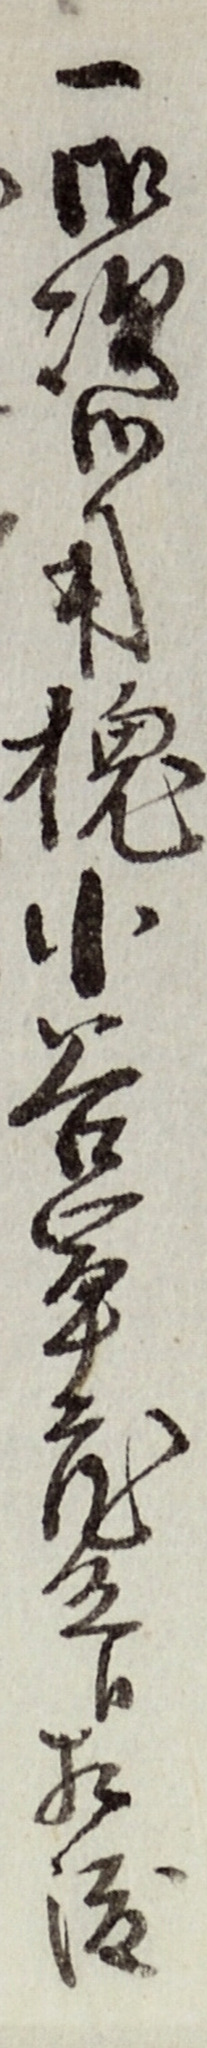一御次御用槐小谷軍蔵殿江相渡
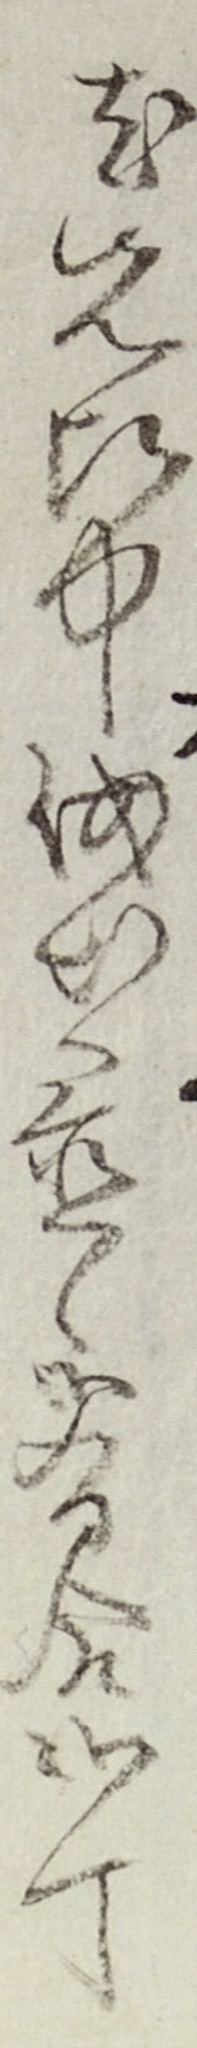尤先頃中伐出置候御有合弐丁
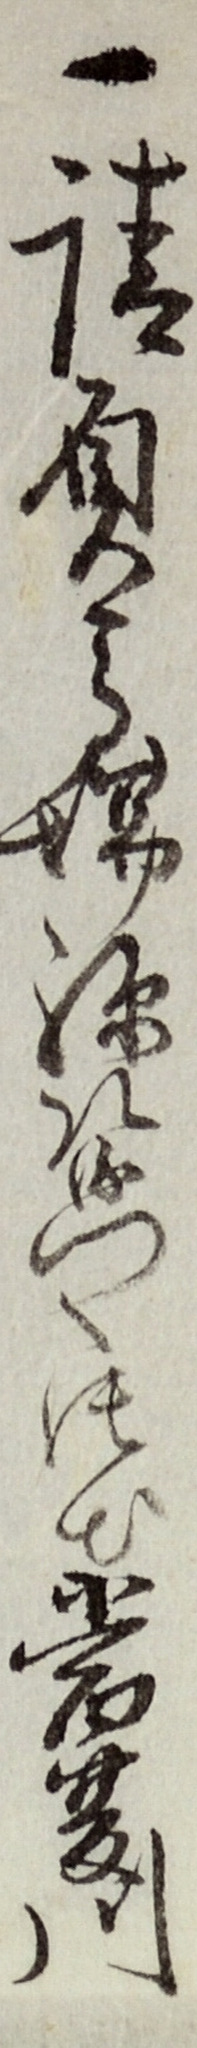一請負馬場源左衛門罷出当夏川
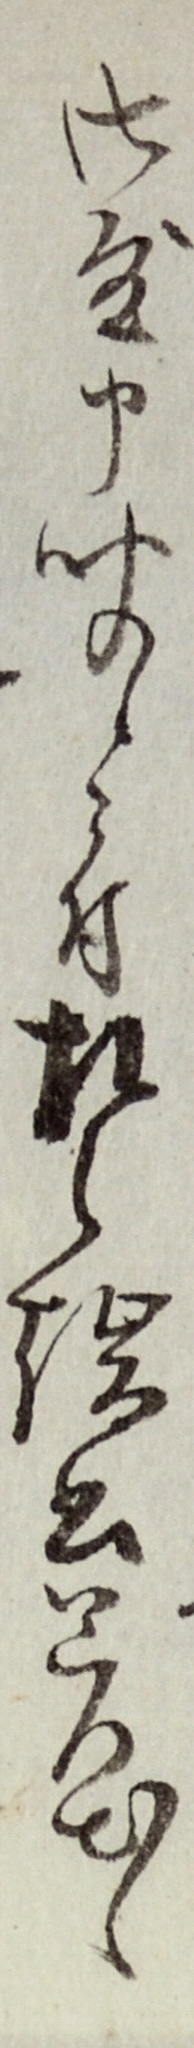仕度申聞候ニ付左之端書差出候
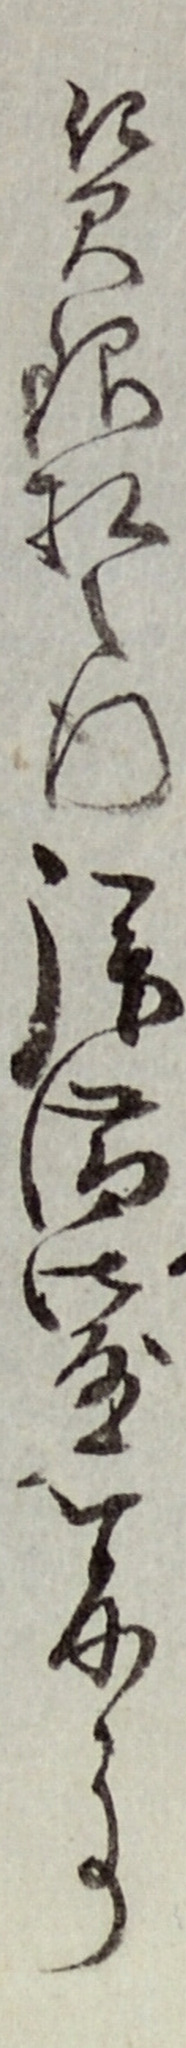賃銀払之内拝借仕度奉存候事

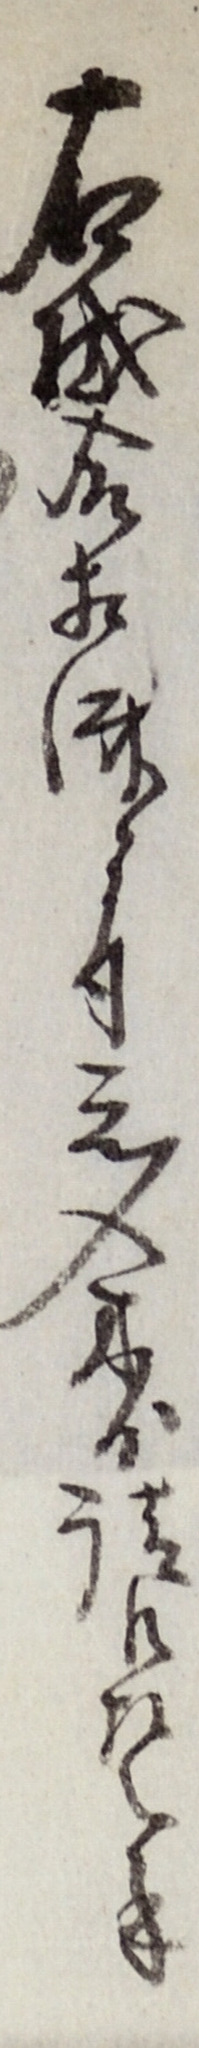右掛合相済候ニ付元〆方ゟ請取左之手
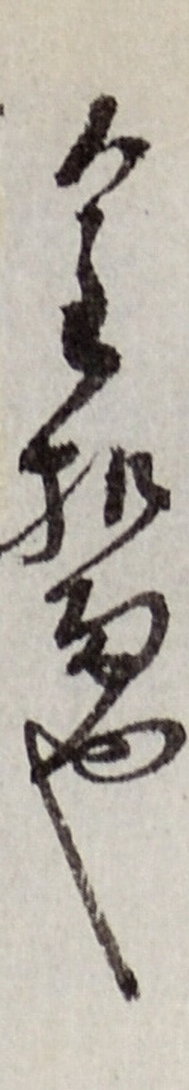金拾両也
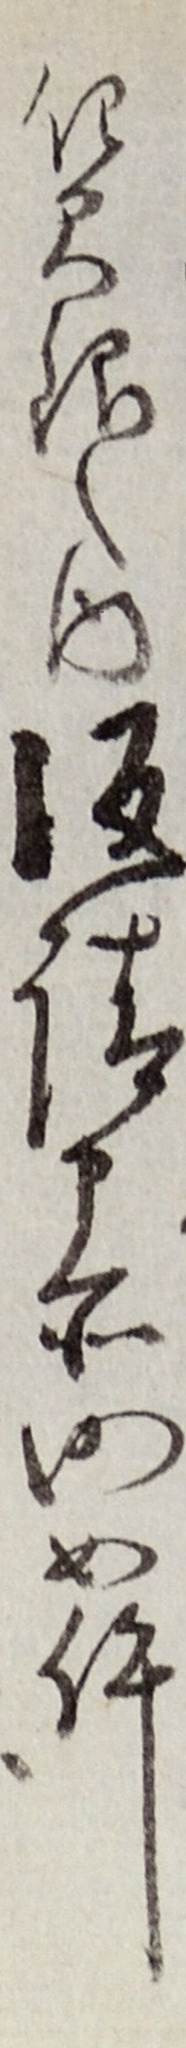賃銀之内仮請申所仍如件
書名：御山方御薪方諸事御用留
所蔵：伊那市立高遠町図書館・合同会社AMANE
